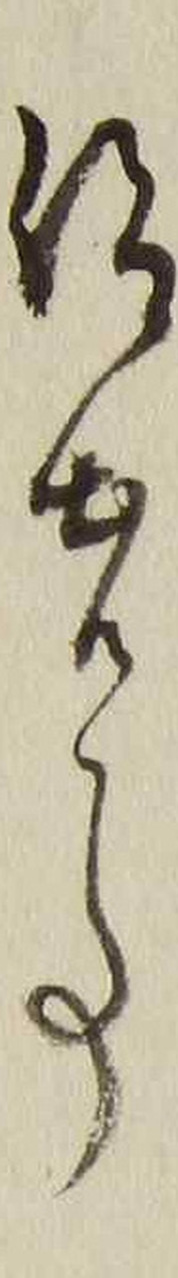仰出候事
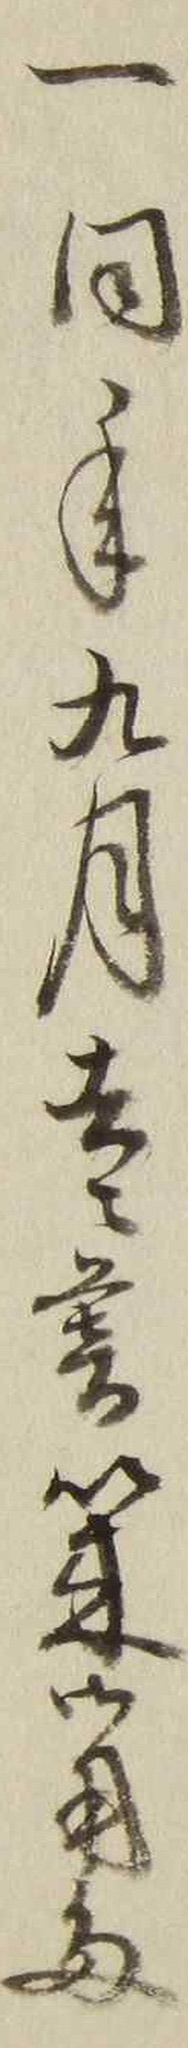一同年九月去々暮以来御用多

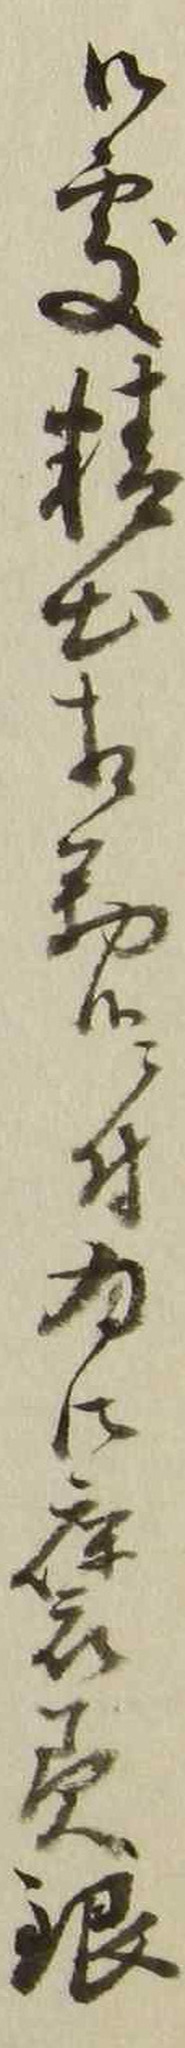候処精出相勤候ニ付為御褒美銀
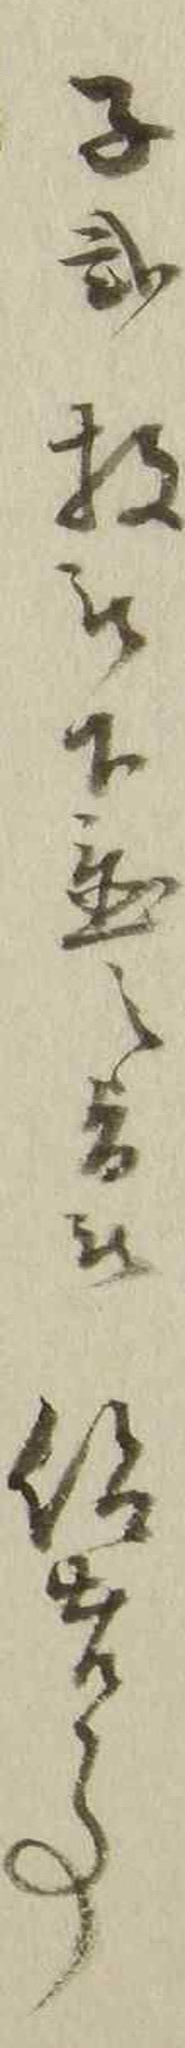子弐枚被下置之旨被仰出候事
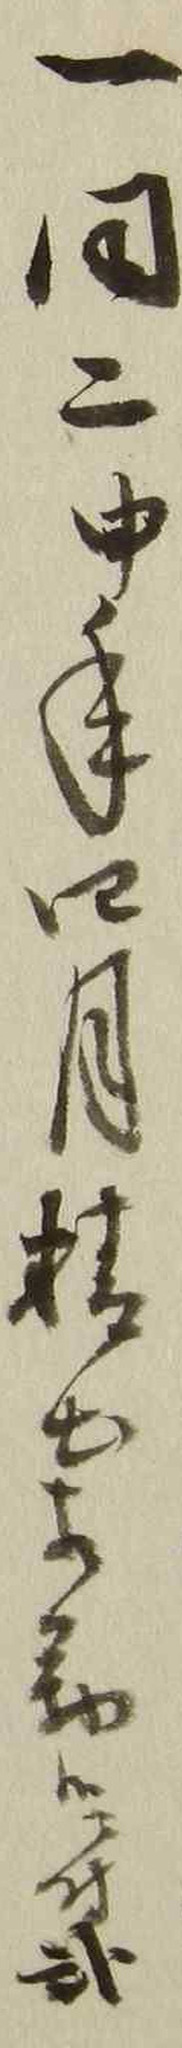一同二申年四月精出相勤候ニ付弐
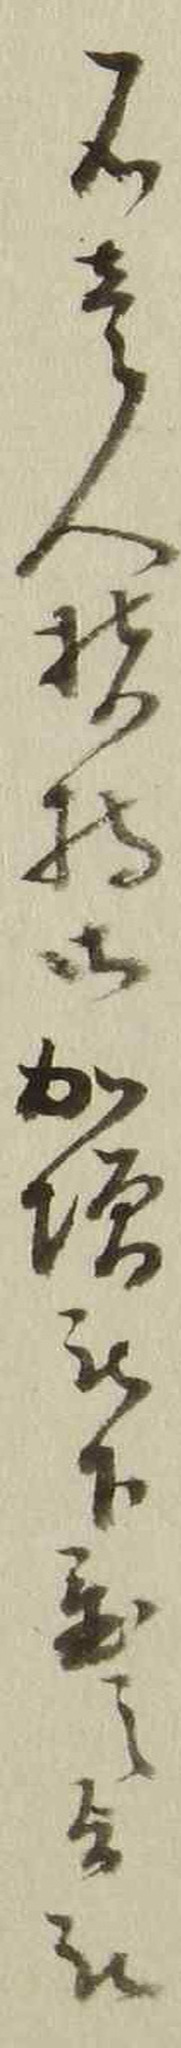石壱人扶持御加増被下置之旨被
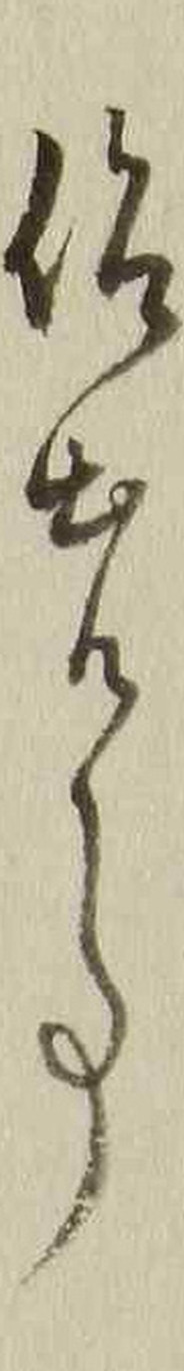仰出候事
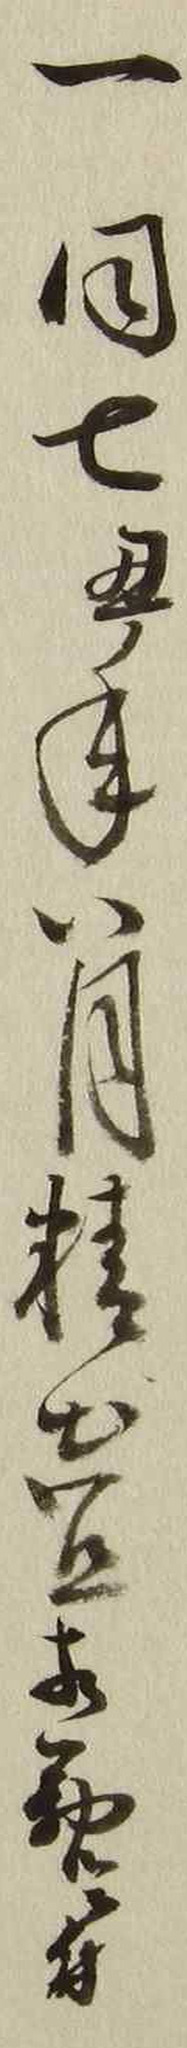一同七丑年八月精出宜相勤候ニ付
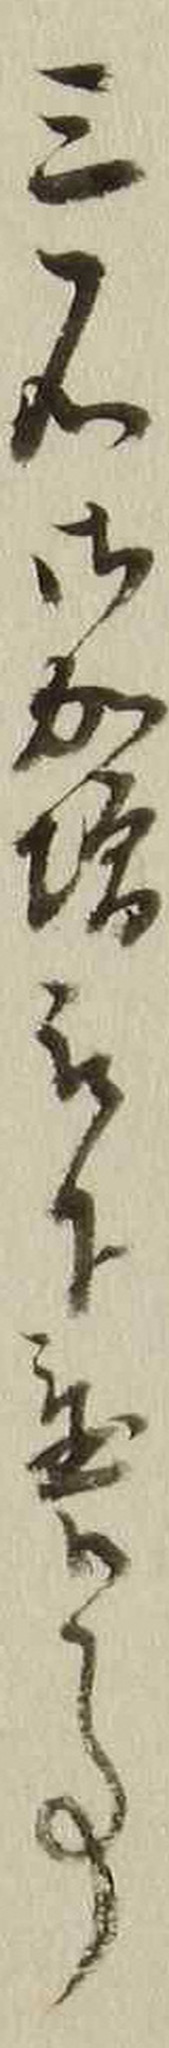三石御加増被下置候事
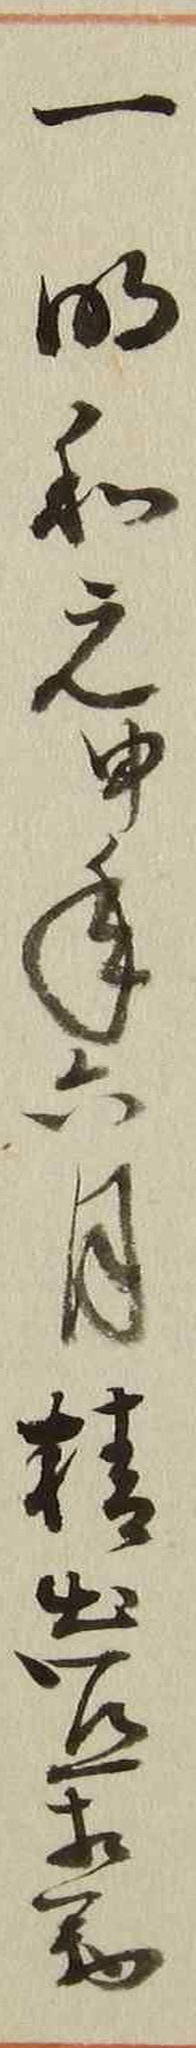一明和元申年六月精出宜相勤
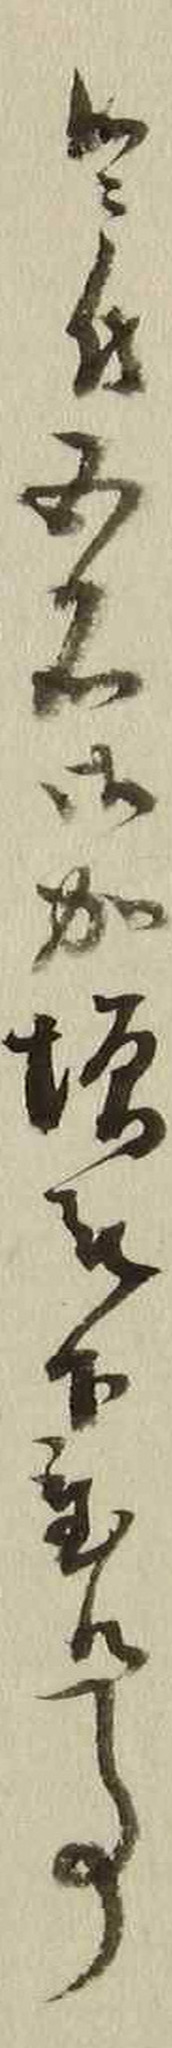候ニ付五石御加増被下置候事
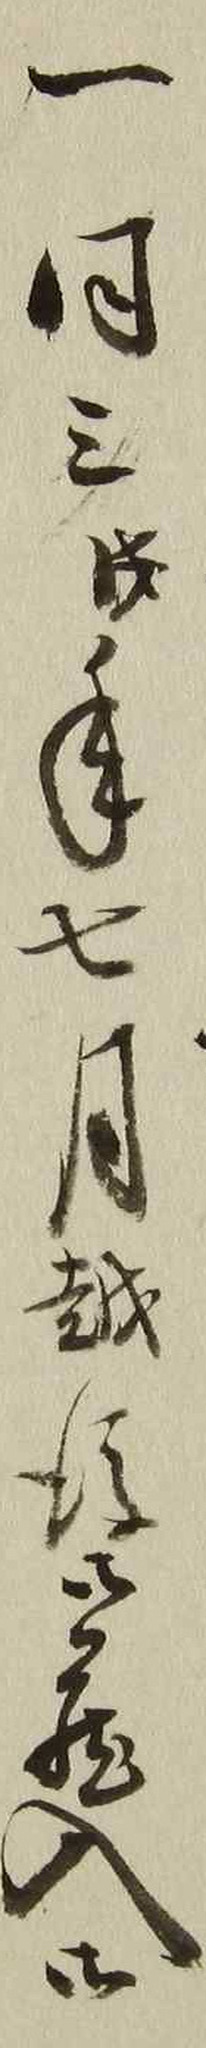一同三戌年七月越後御蔵入御
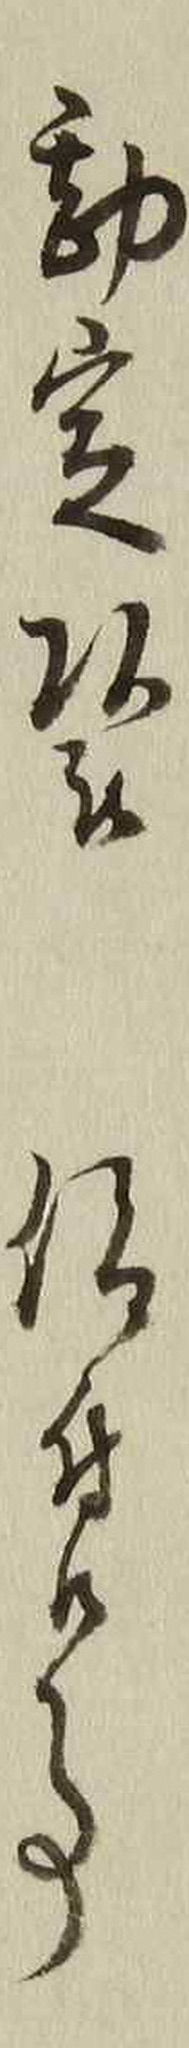勘定頭被仰付候事
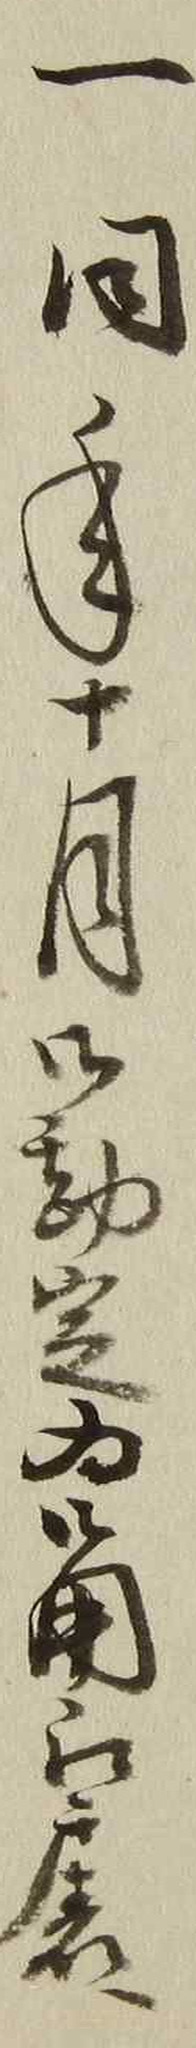一同年十月御勘定為御用江戸
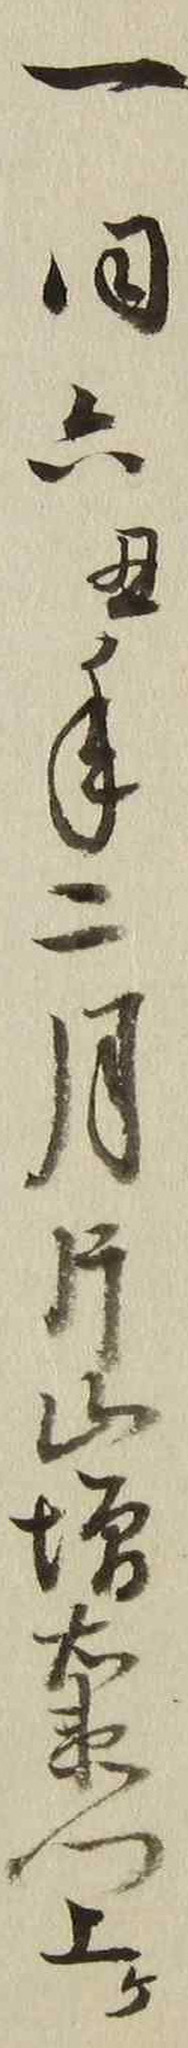一同六丑年二月片山増右衛門上ヶ
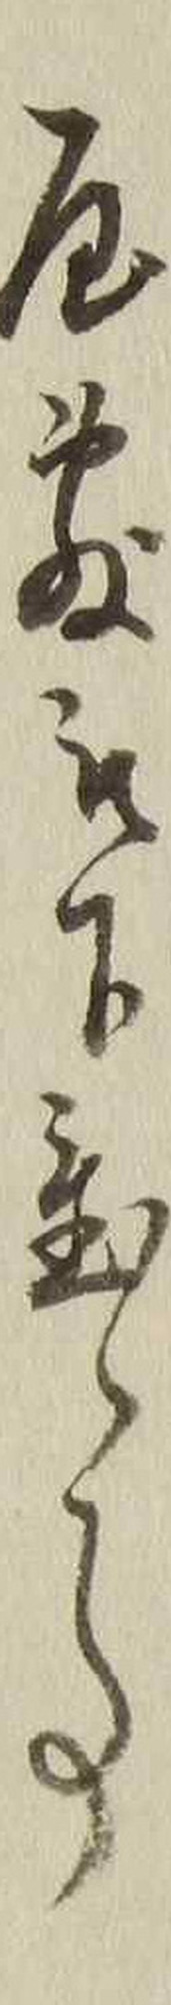屋敷被下置候事
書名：諸士系譜　巻之53　に之部4
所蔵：会津若松市立会津図書館
